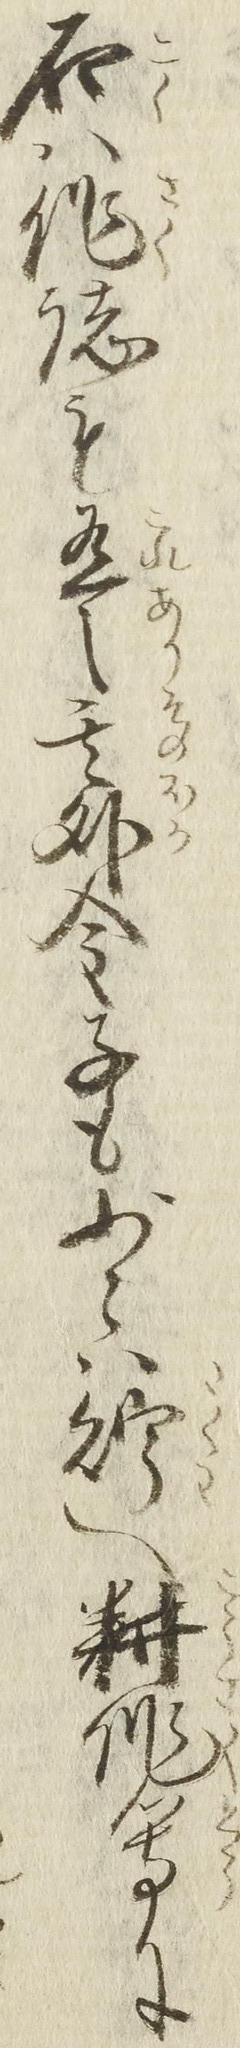石は作誌も有之其外金子も少〻は貯へ耕作等に
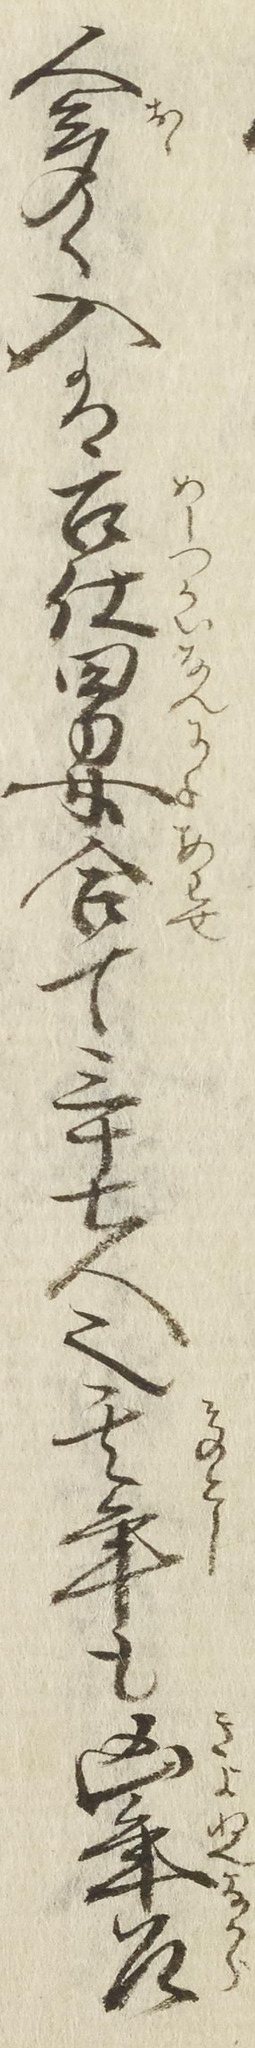人多く入は召仕男女合て三十七人也其年も凶年乍
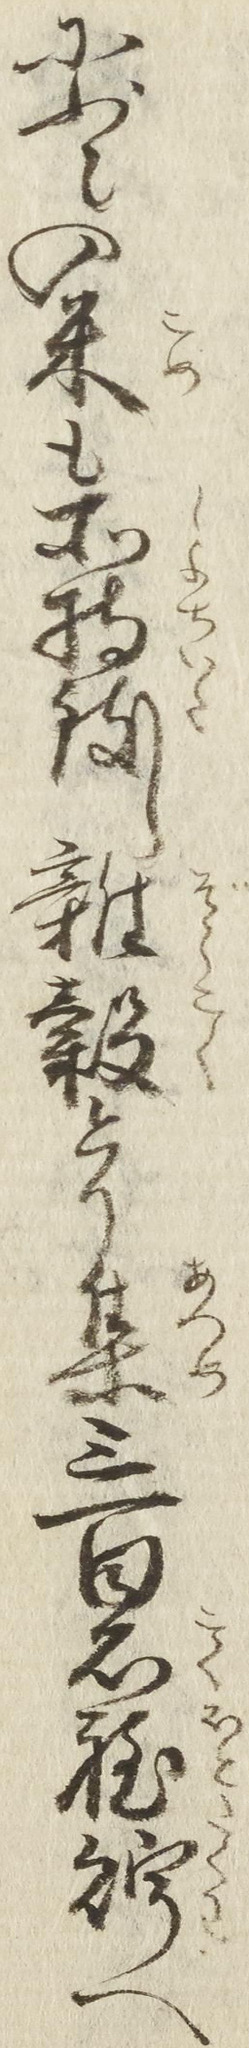に少〻の米も所持致し雑穀とり集三百石程貯へ
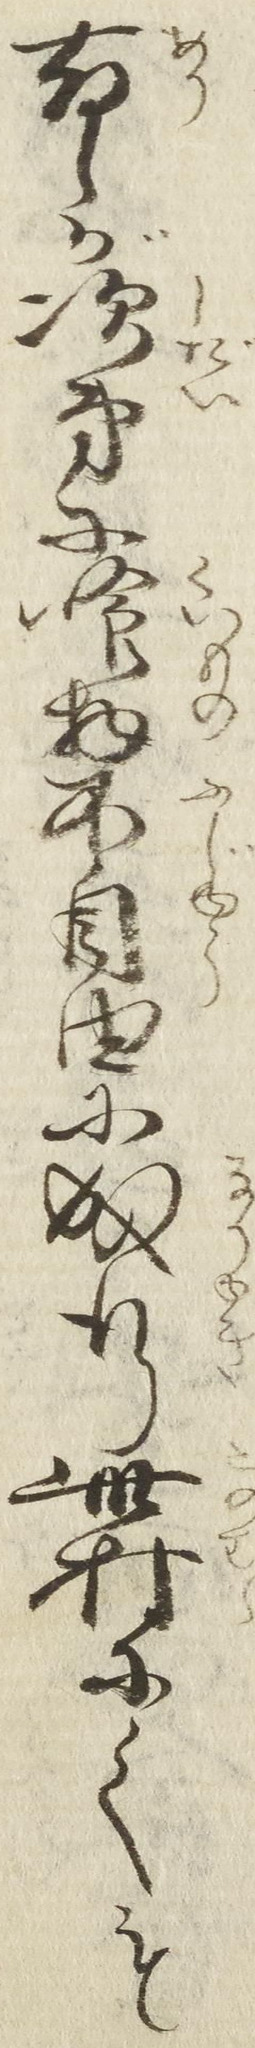有しが次第に喰物不自由に成行此村にても
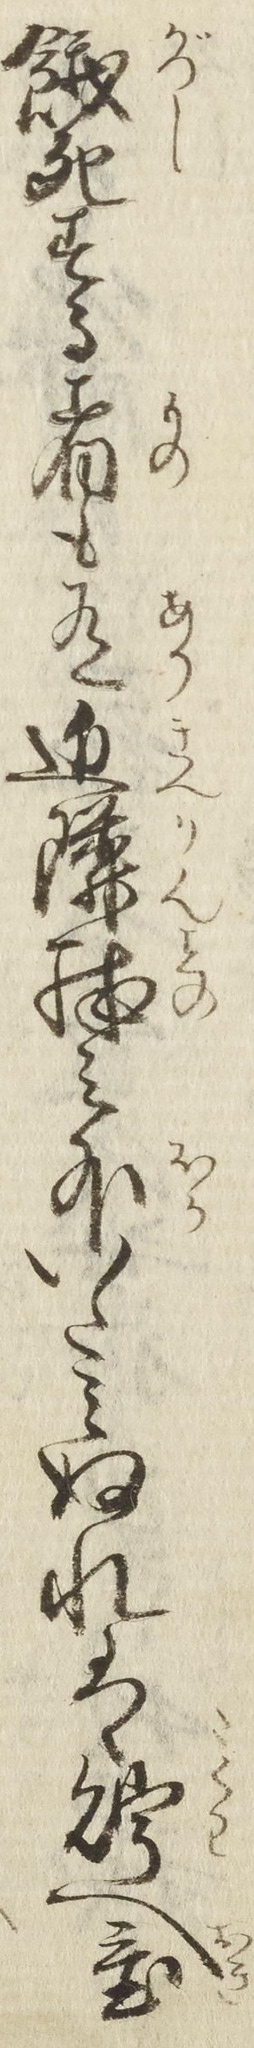餓死する者も有近隣殊之外いたみぬれは貯へ置
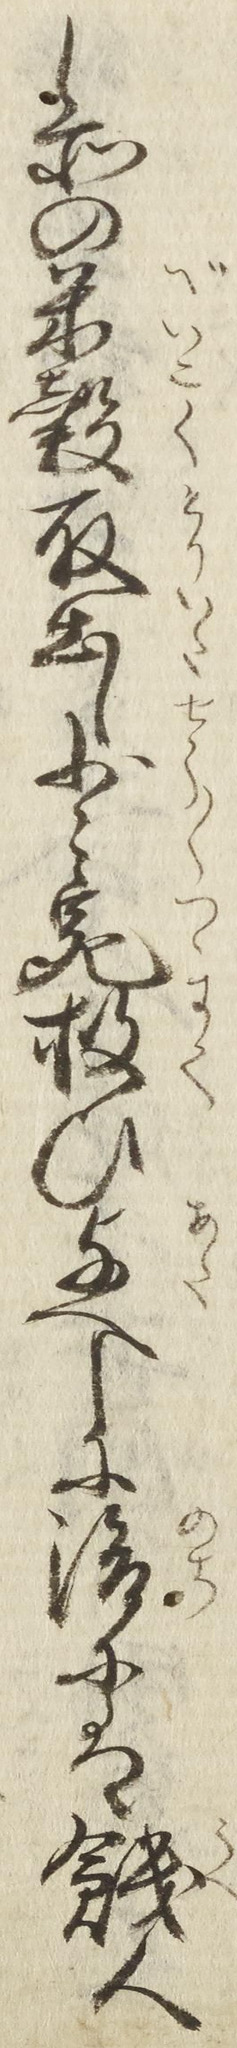し前の米穀取出し少〻宛救ひ与へしに後には餓人
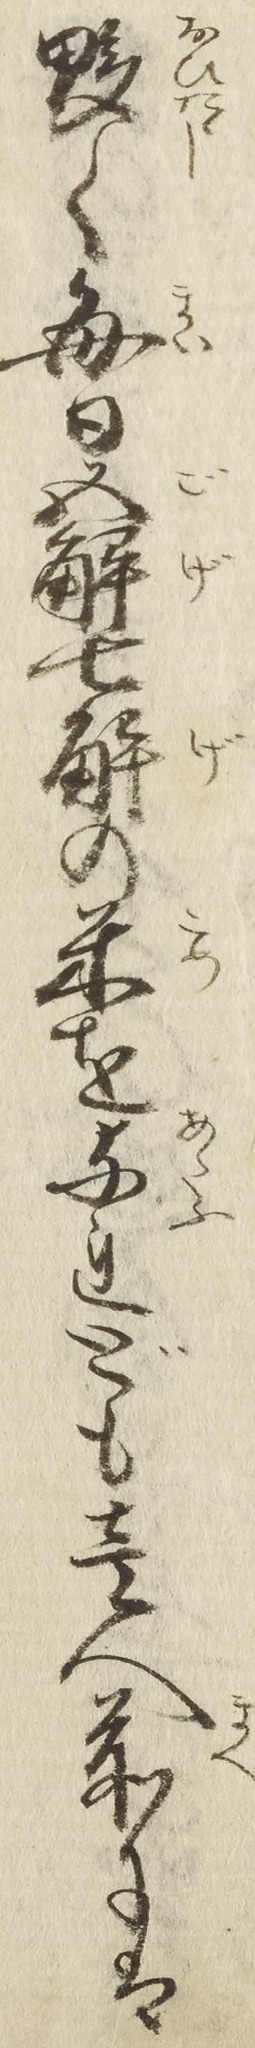夥く毎日五解七解の米を与れども壱人前には

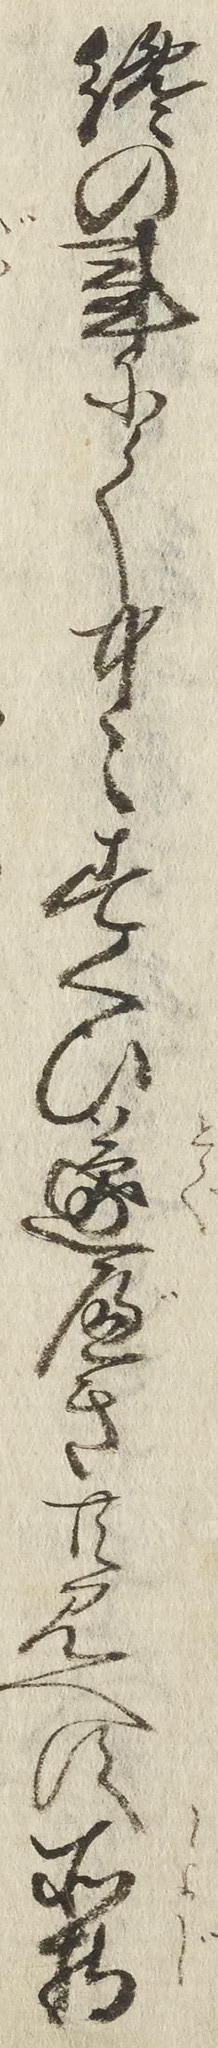纔の事にて中〻すくひ遂べき共見へす所持
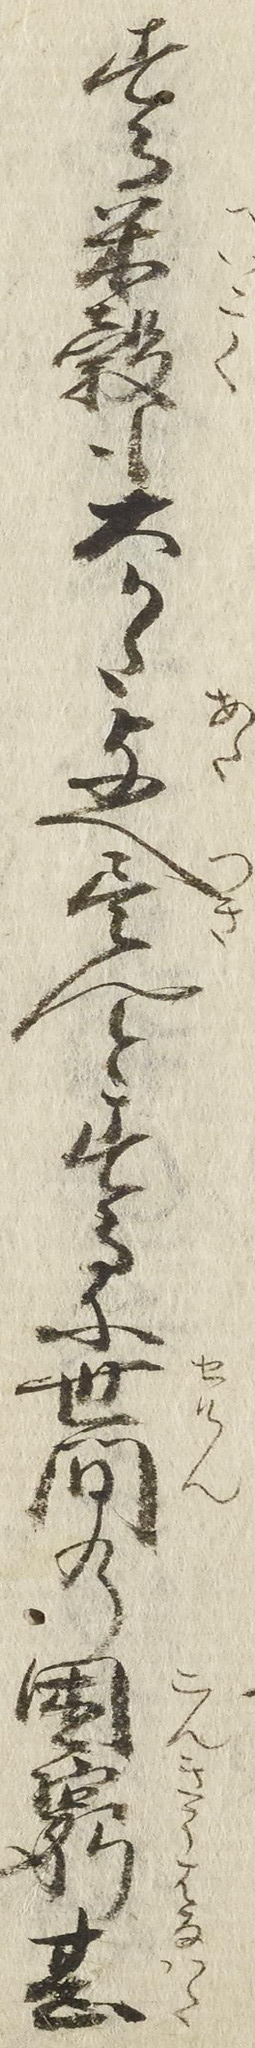する米穀も大かた与へ尽んとするに世間の困窮甚
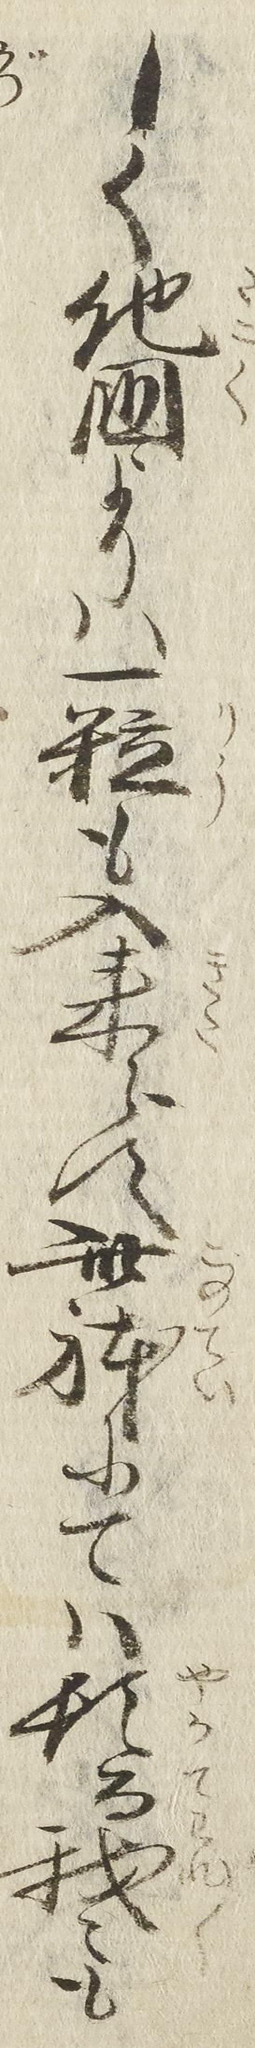しく他国よりは一粒も入来らす此躰にては頓而我〻も
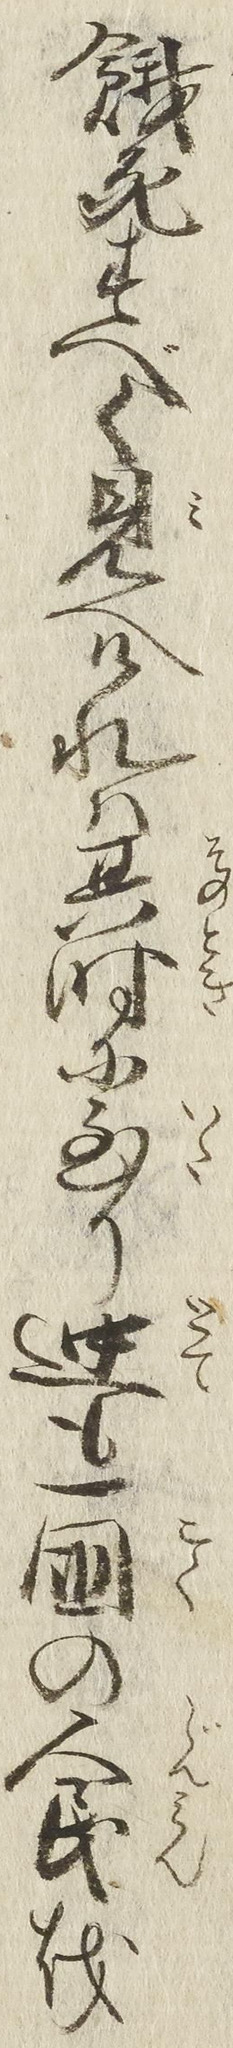餓死すべく見へけれは其時に至り迚も一国の人民を
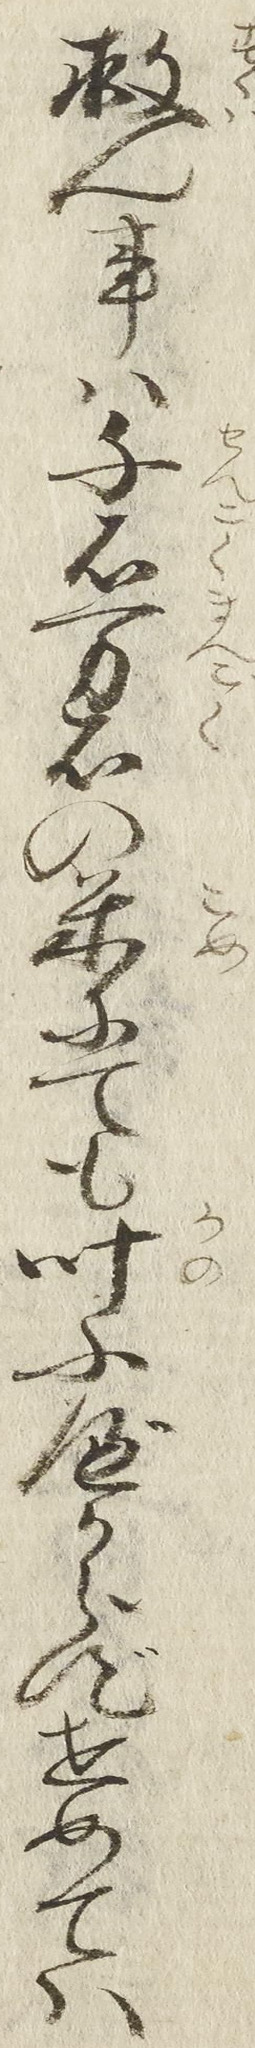救ん事は千石万石の米にても叶ふへからずせめては
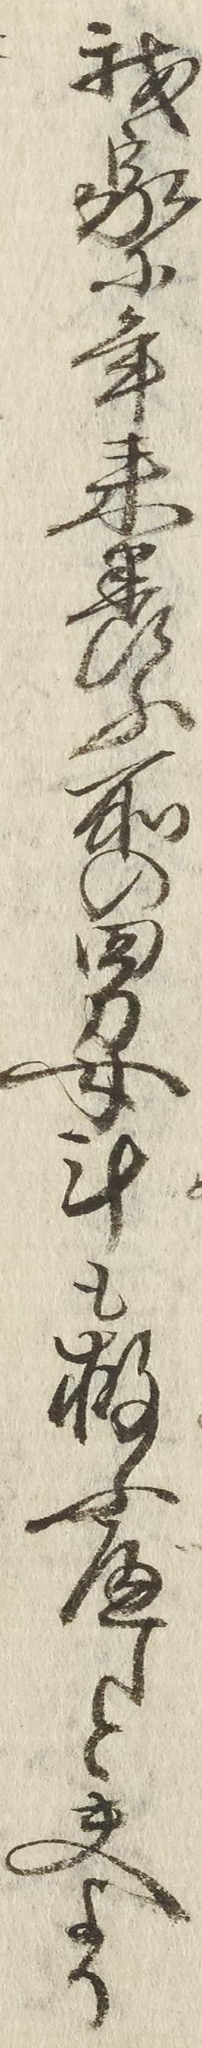我家に年来養ふ所の男女斗も救ふへしと夫より
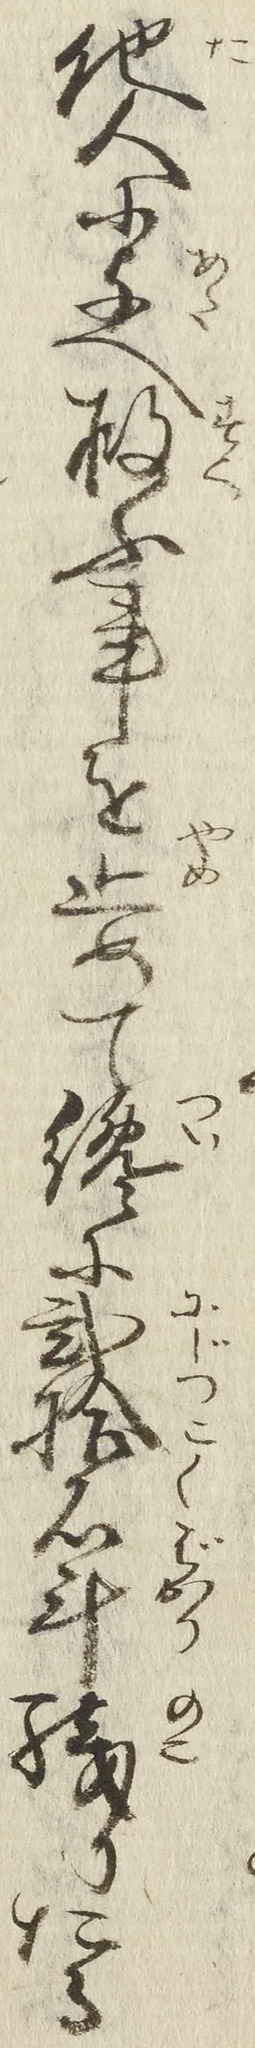他人に与へ救ふ事を止めて終に弐拾石斗残りたる
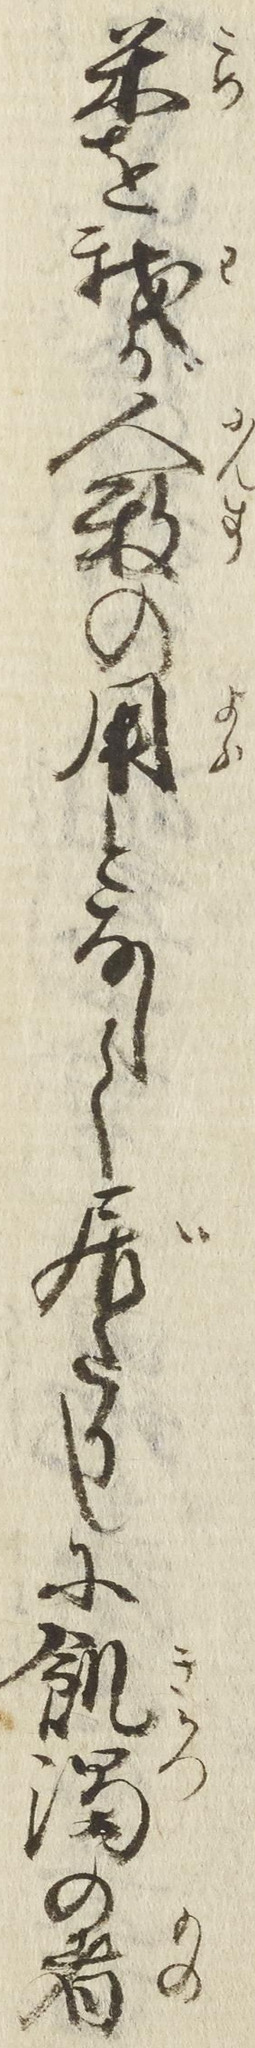米を我が人数の用となして居たりしに飢渇の者
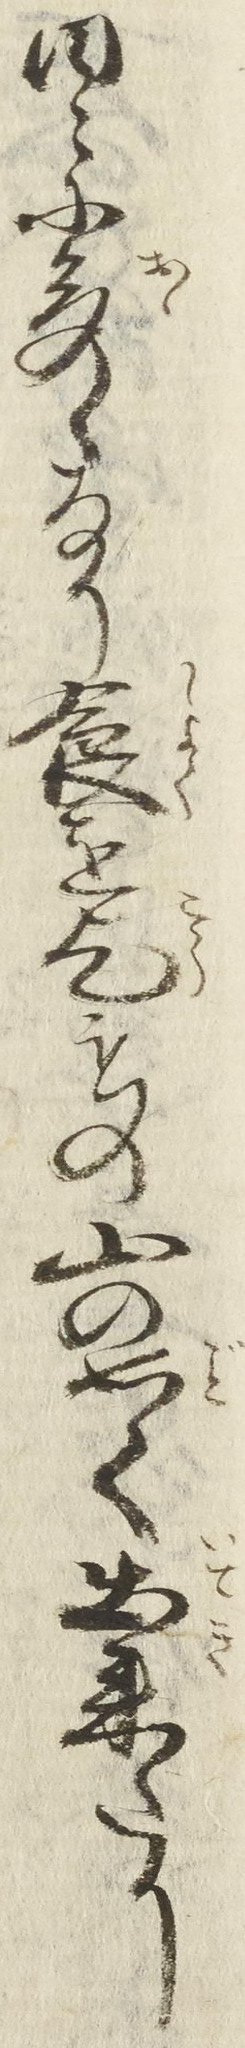日〻に多くなり食を乞もの山の如く出来たり
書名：天明奇畧　全
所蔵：東京大学地震研究所図書室 Earthquake Research Institute Library, The University of Tokyo, JAPAN
